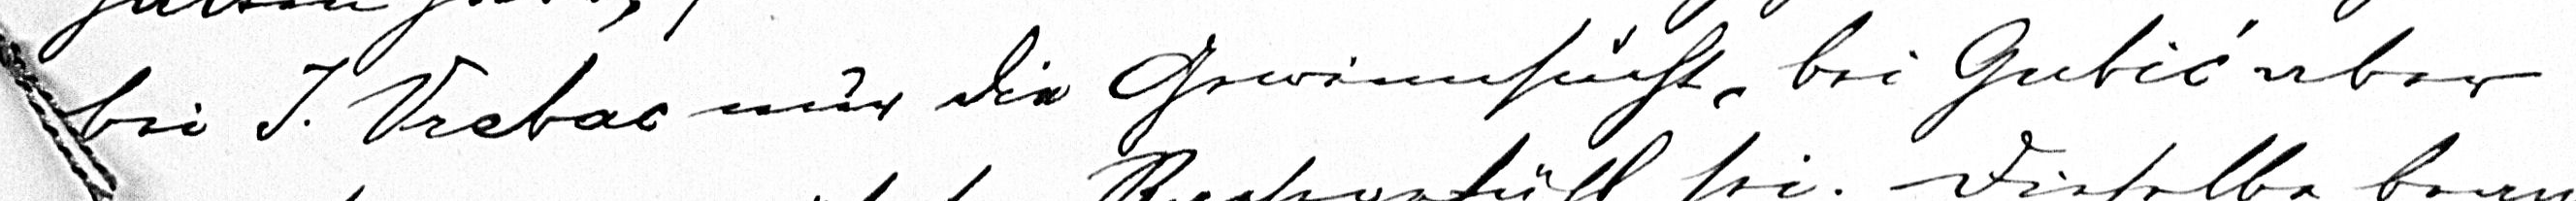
bei J. Vrebac nur die Gewinnsucht, bei Gubić aber
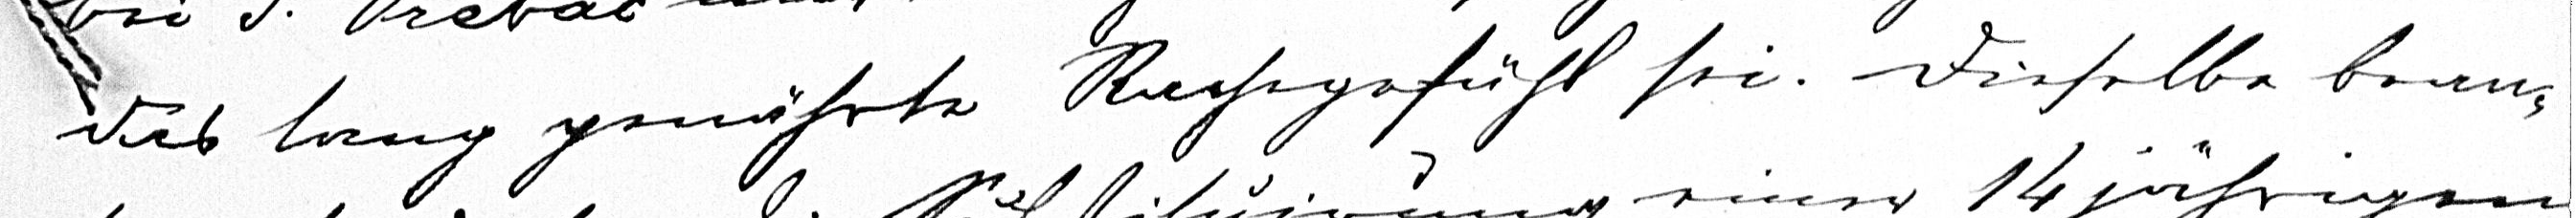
das lang genährte Rachegefühl sei. Dieselbe bean¬
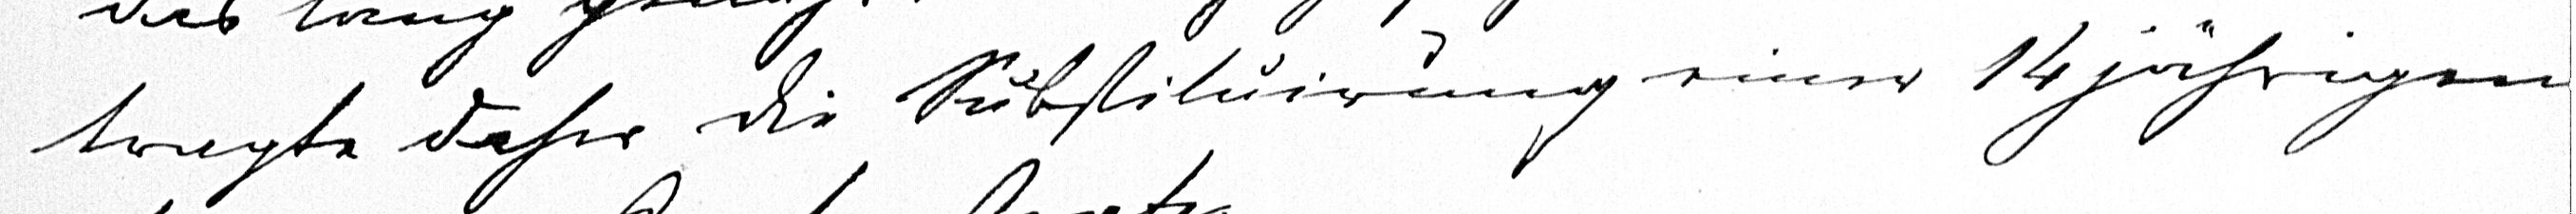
tragte daher die Substituirung einer 14jährigen
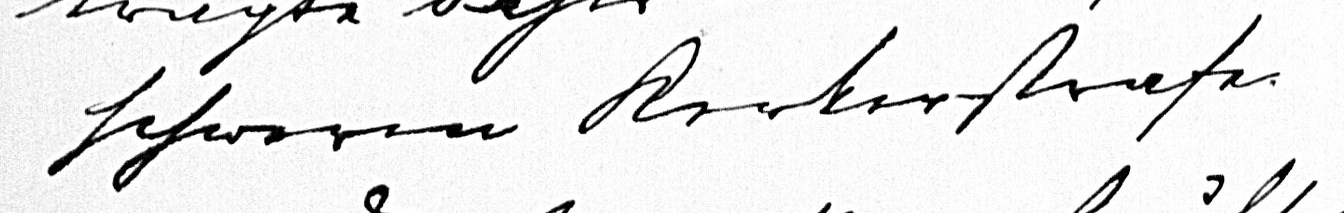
schweren Kerkerstrafe.
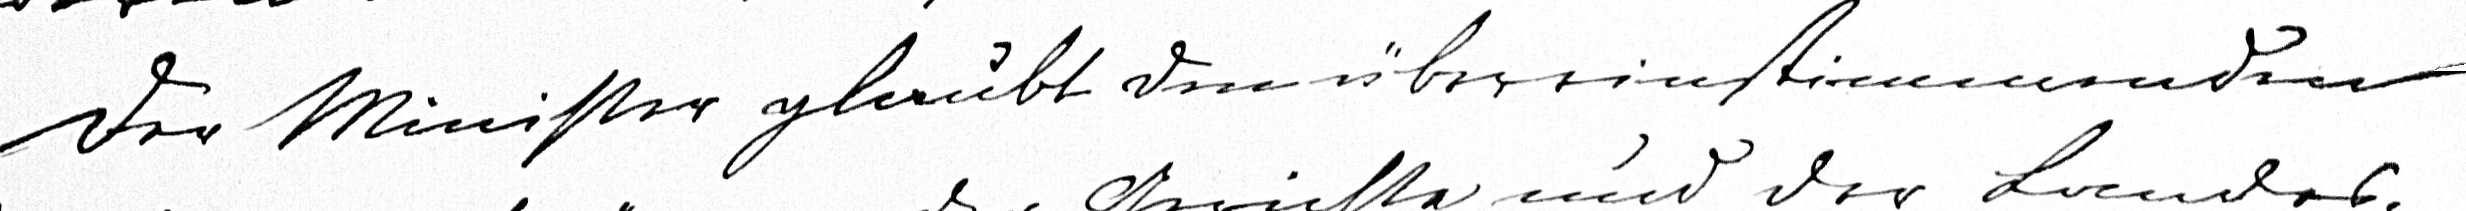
Der Minister glaubt den übereinstimmenden
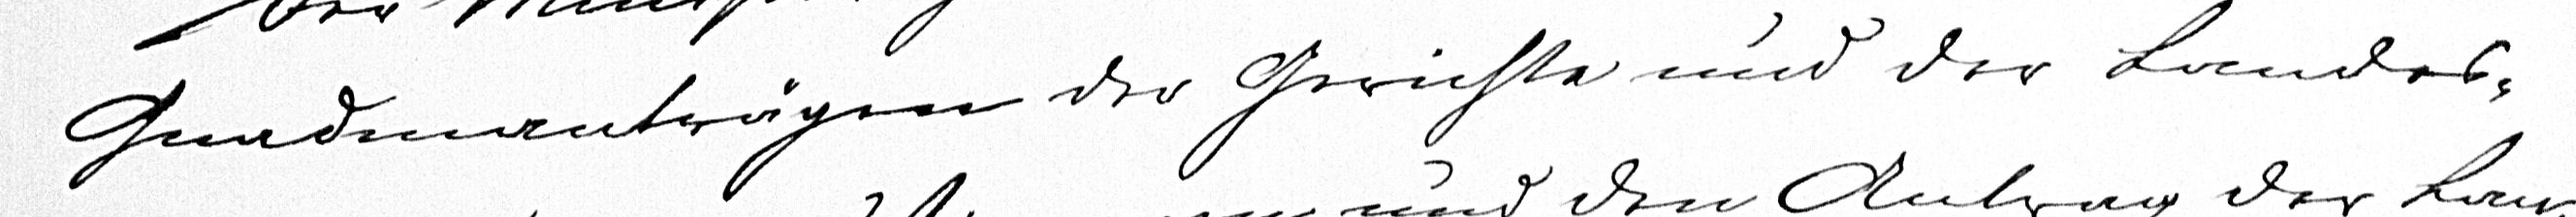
Gnadenanträgen der Gerichte und der Landes¬
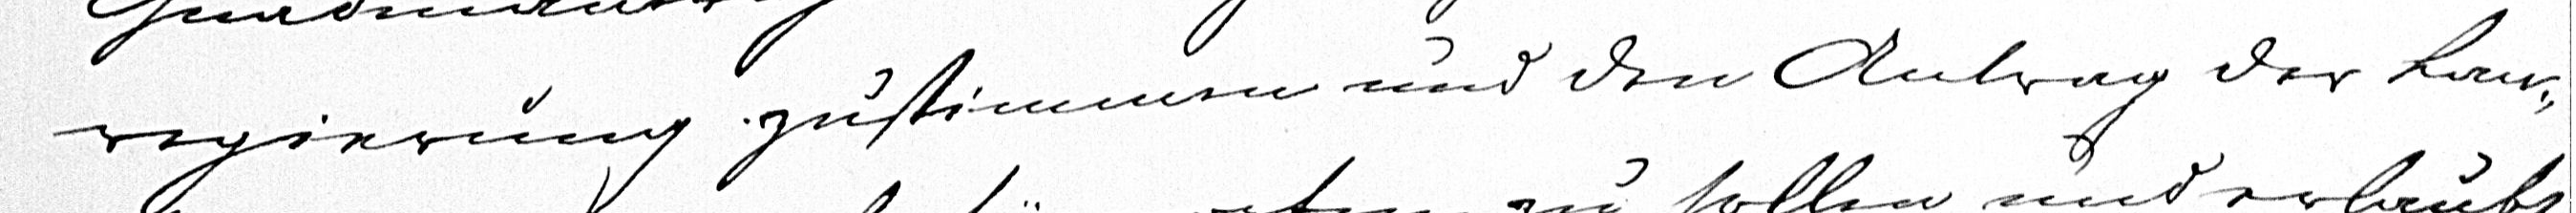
regierung zustimmen und den Antrag der Lan¬
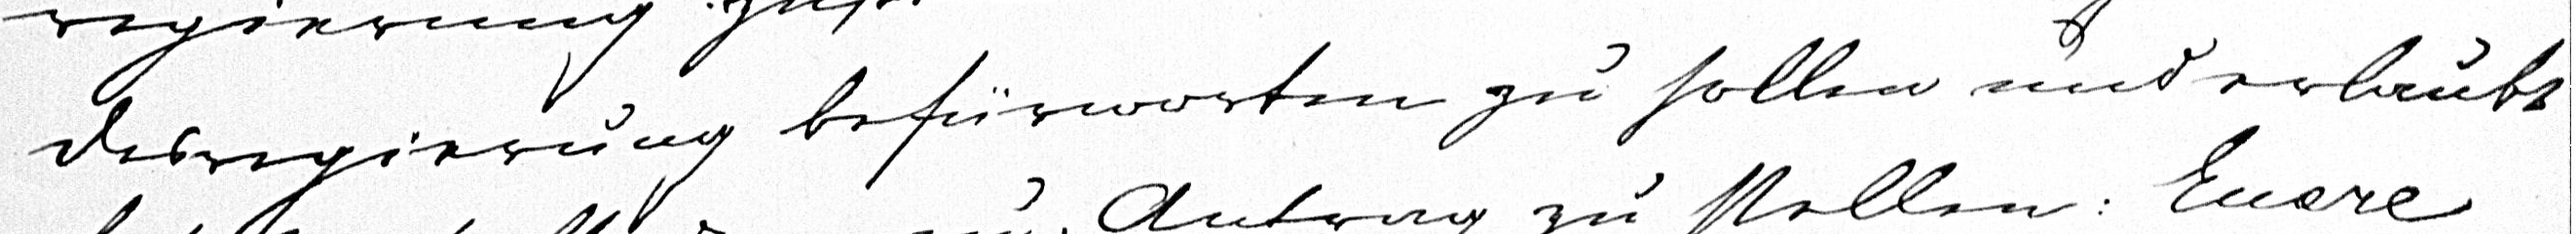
desregierung befürworten zu holten und erlaubt
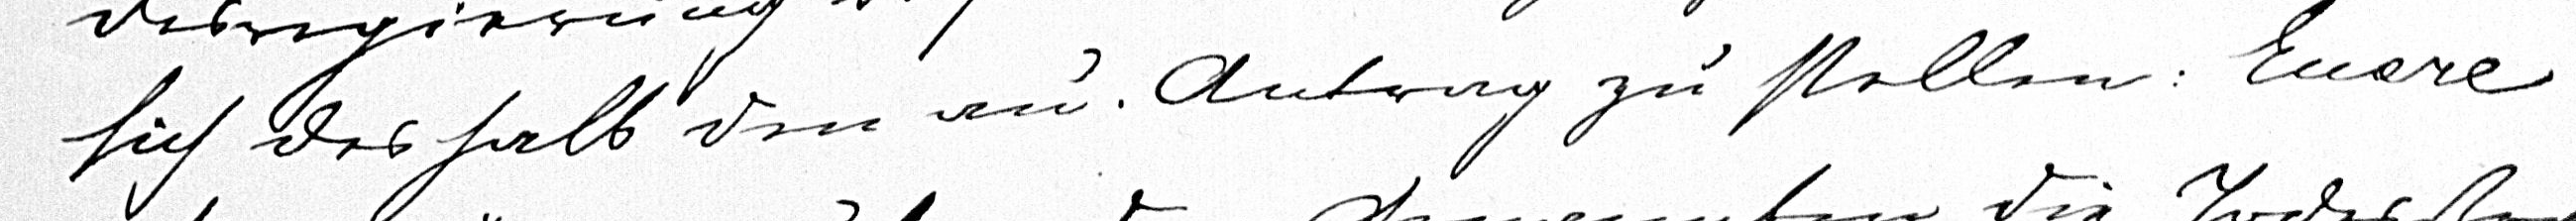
sich des hals den au. Antrag zu stellen: Euere
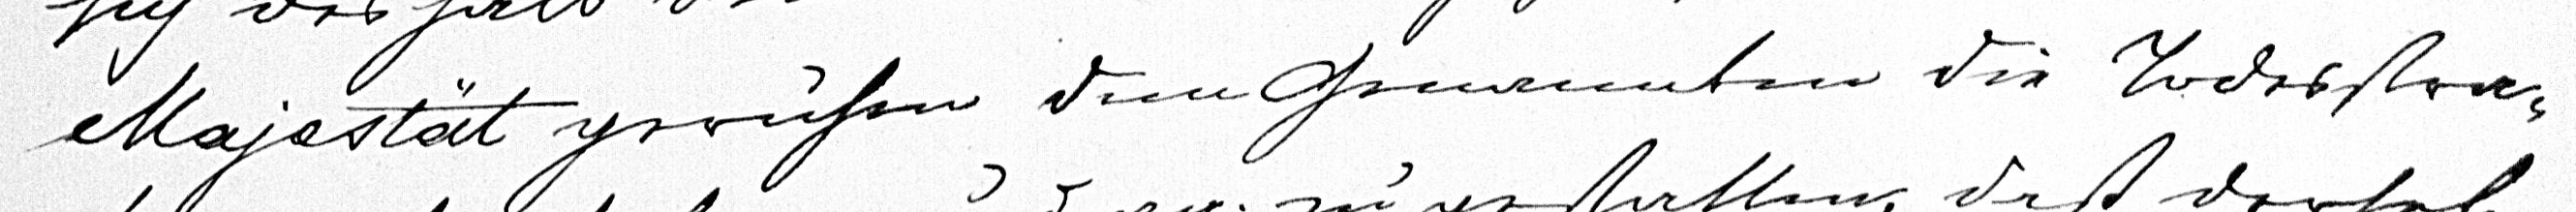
Majestät geruhen den Genannten die Todesstra¬
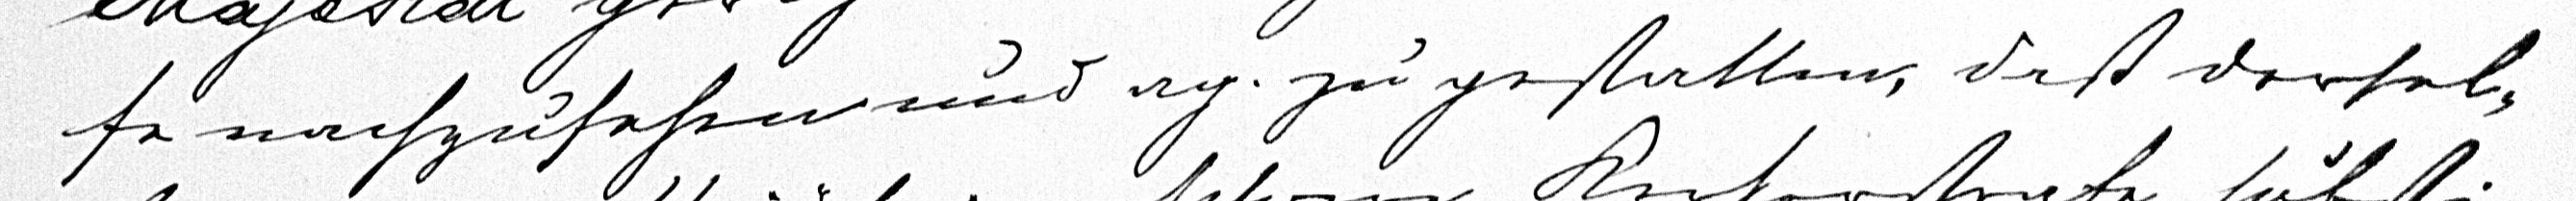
fe nachzusehen und ag. zu gestatten, daß dersel¬
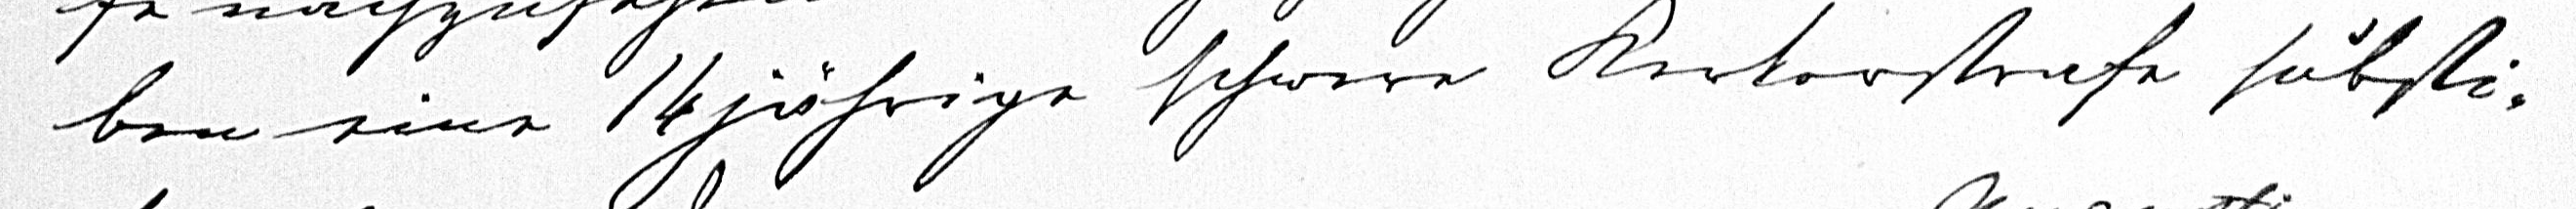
ben eine 14jährige schwere Kerkerstrafe substi¬
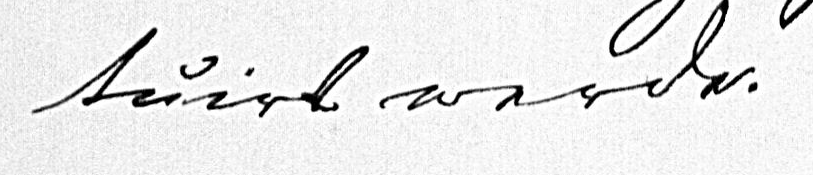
tuirt werde.
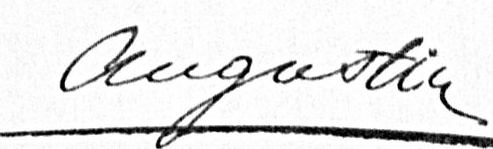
Augustin
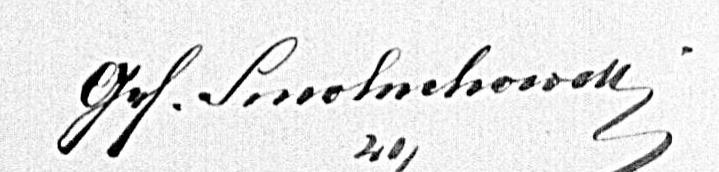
Ges. Smolxx
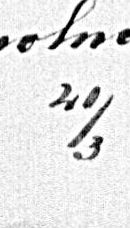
20/3
